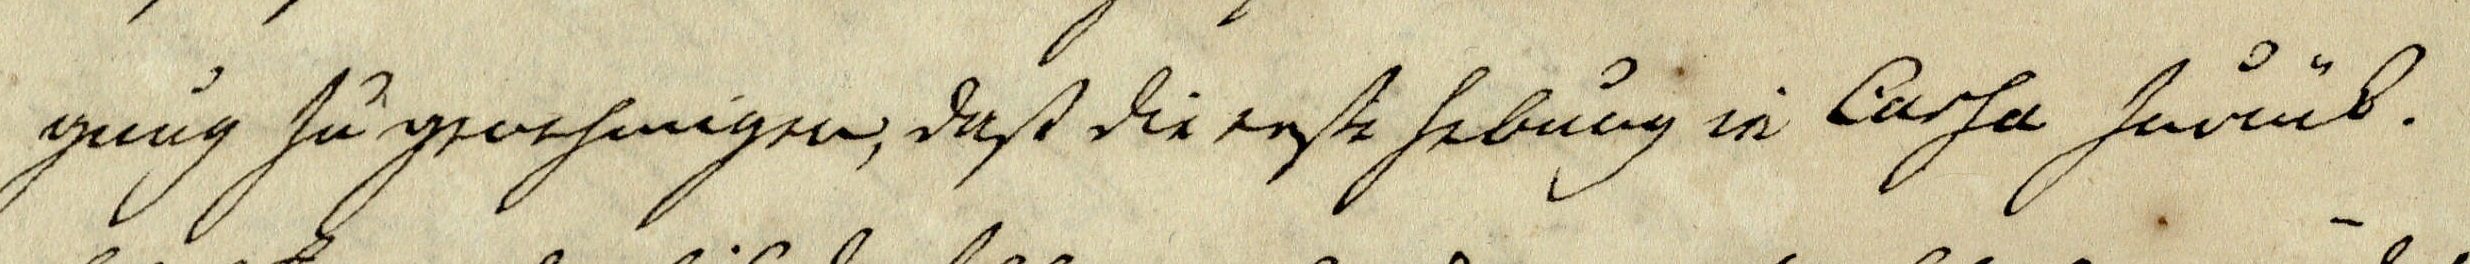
gung zu genehmigen, daß die erste Hebung in Cassa zurück¬
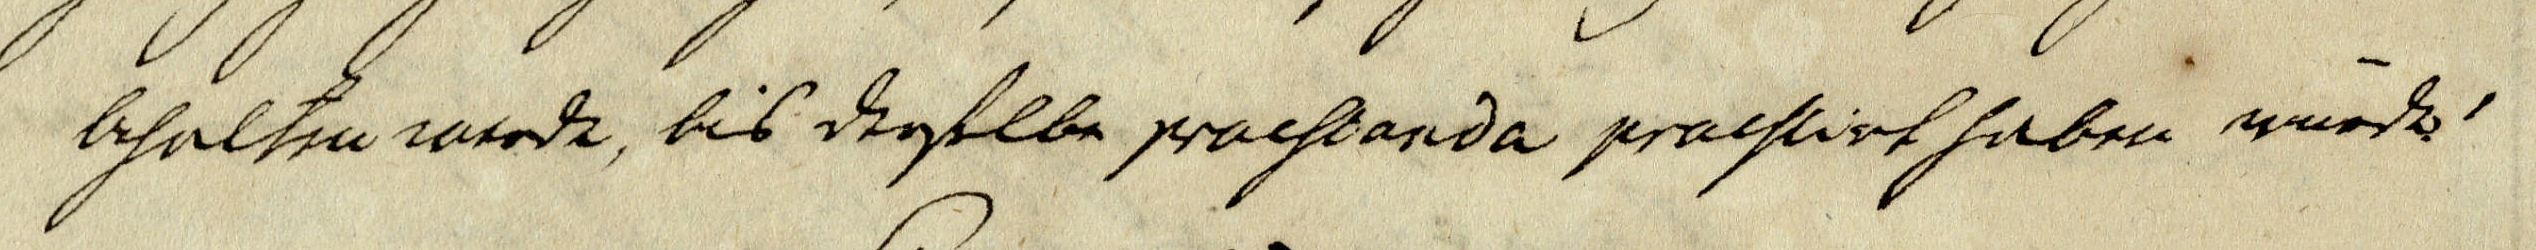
behalten werde, bis derselbe praestanda praestirt haben würde.
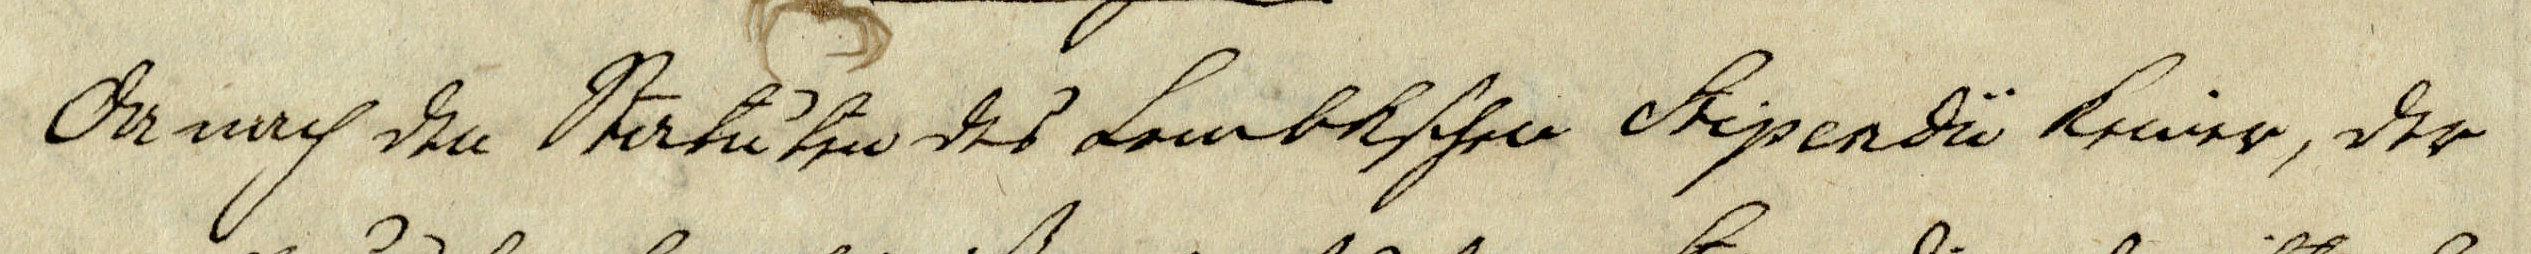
Da nach den Statuten des Lembkschen Stipendii keiner, der
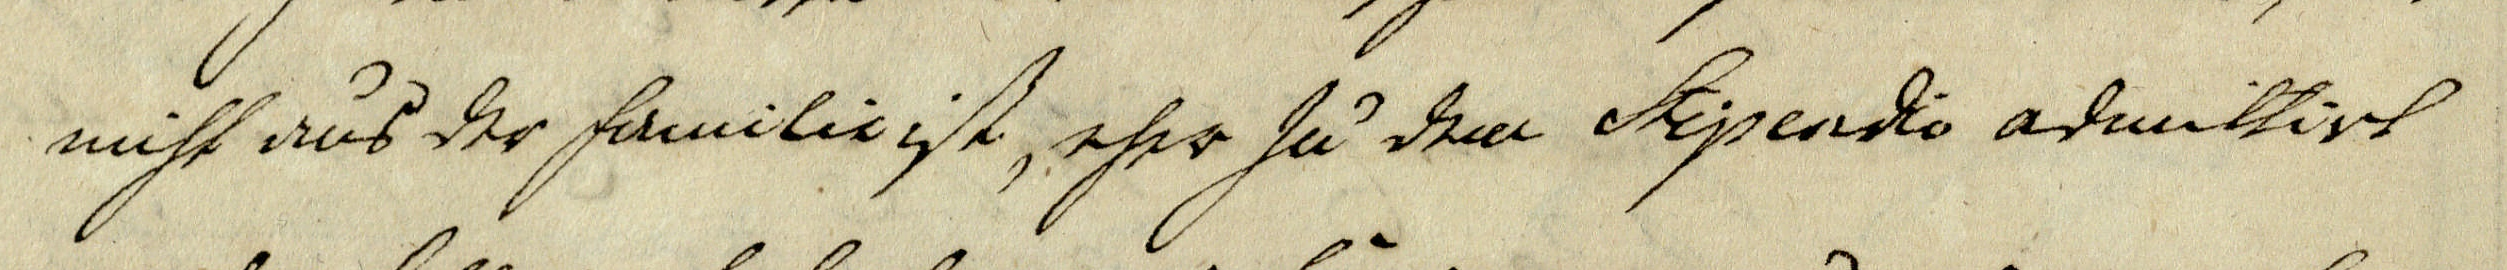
nicht aus der Familie ist, eher zu dem Stipendio admittirt
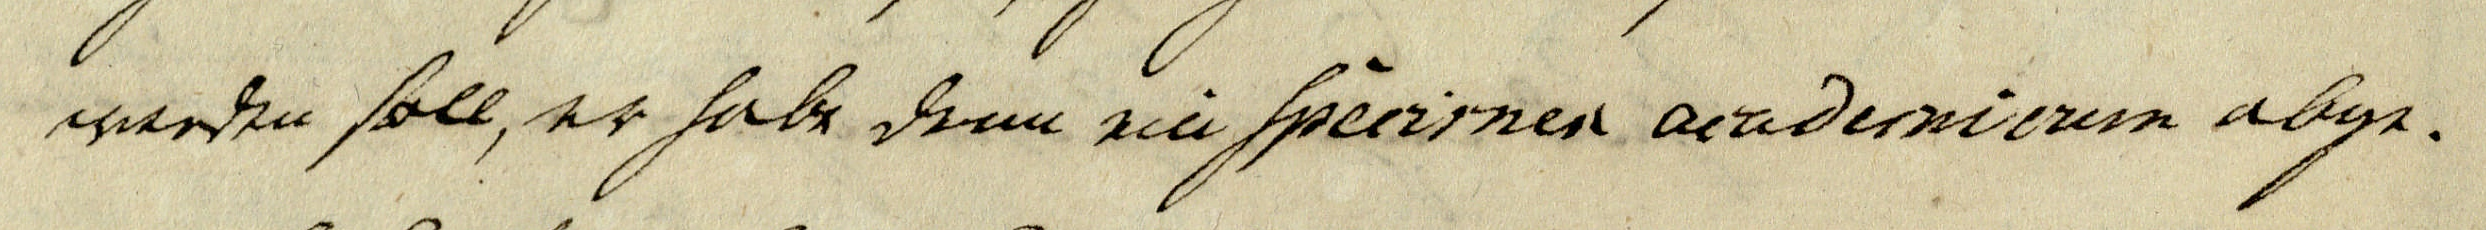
werden soll, er habe denn ein specimen academicum abge¬
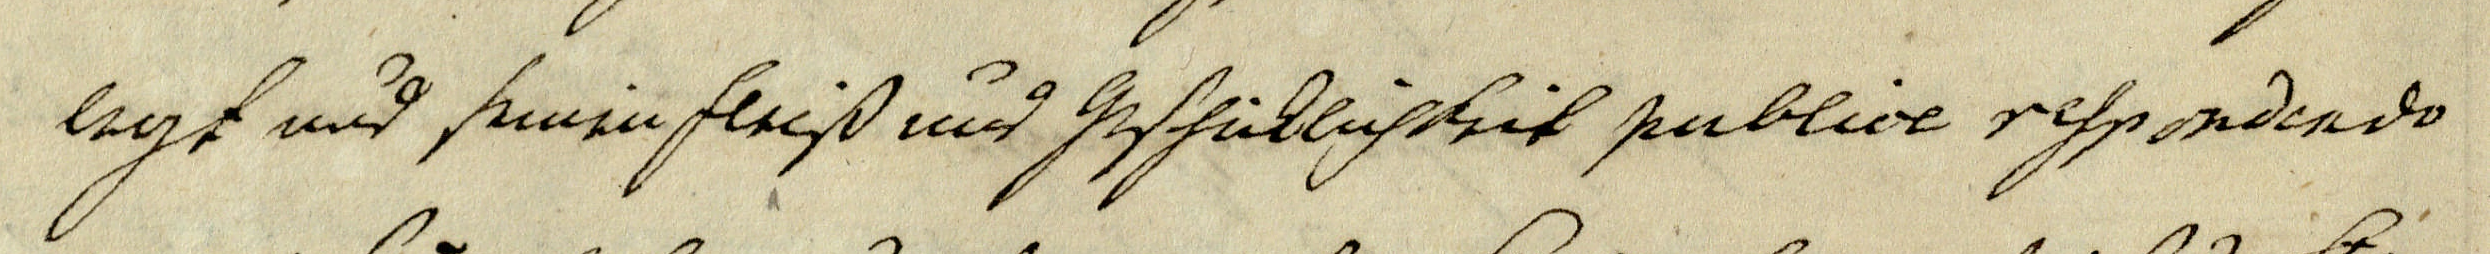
legt und seinen Fleiß und Geschicklichkeit publice respondendo
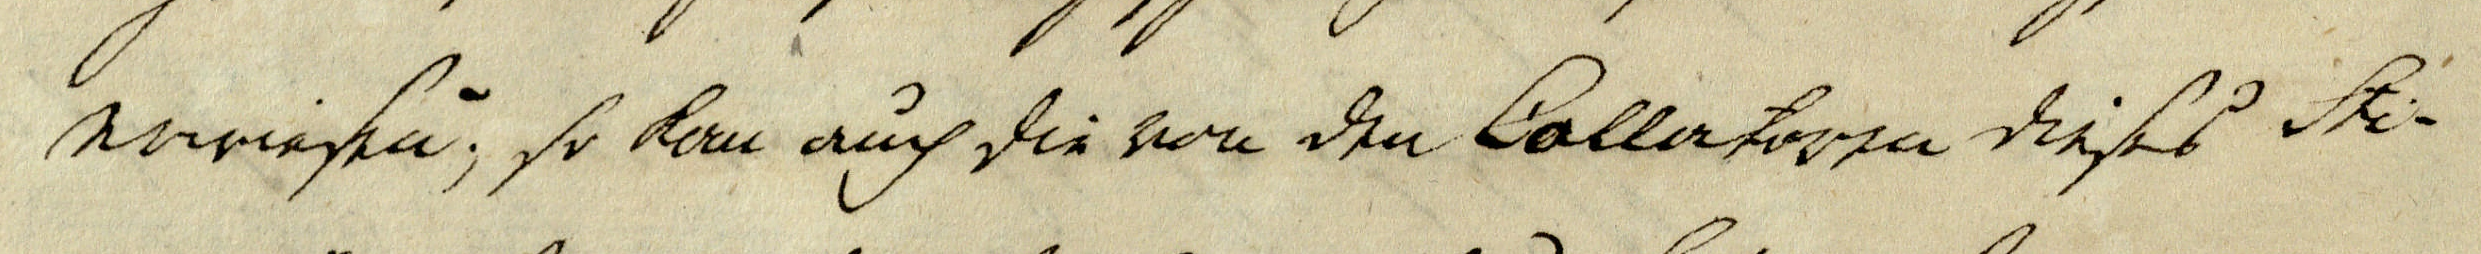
erwiesen; so kan auch die von den Collatoren dieses Sti¬
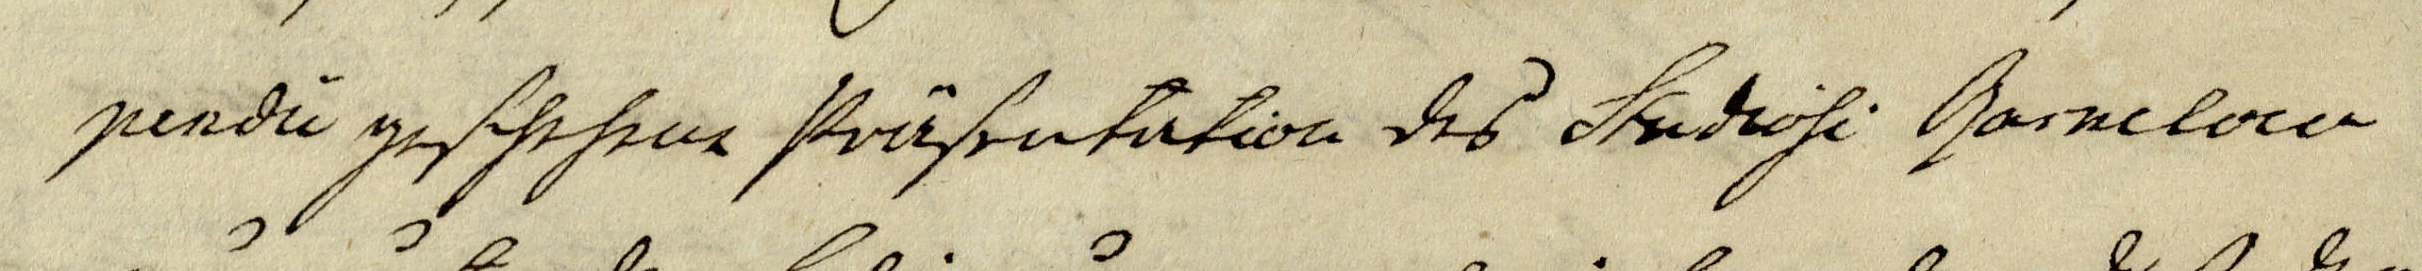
pendii geschehene Präsentation des Studiosi Ramelow
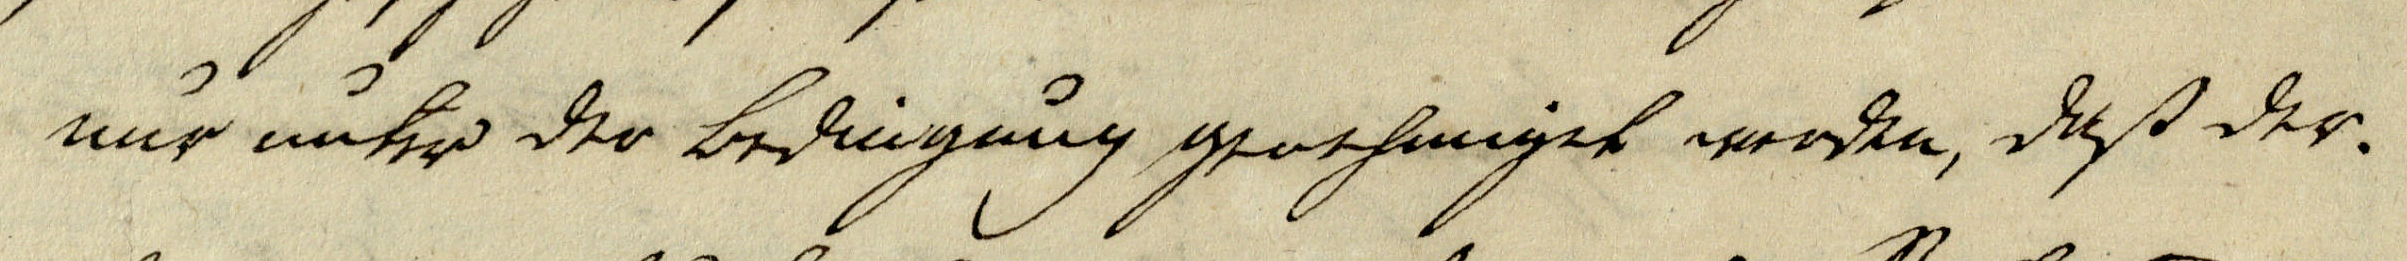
nur unter der Bedingung genehmiget werden, daß der¬
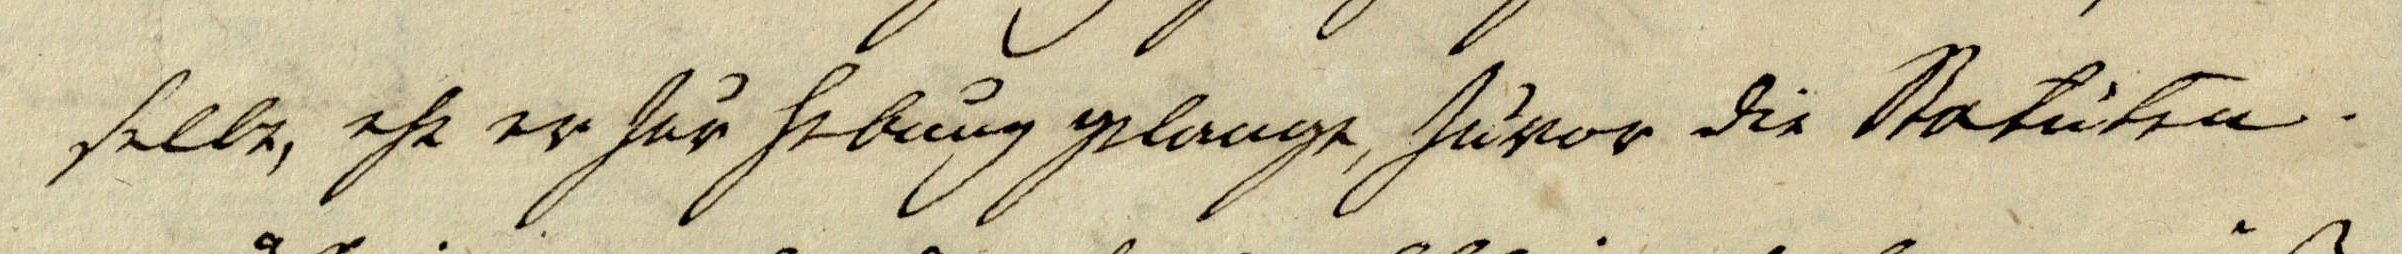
selbe, ehe er zur Hebung gelange, zuvor die Statuten¬
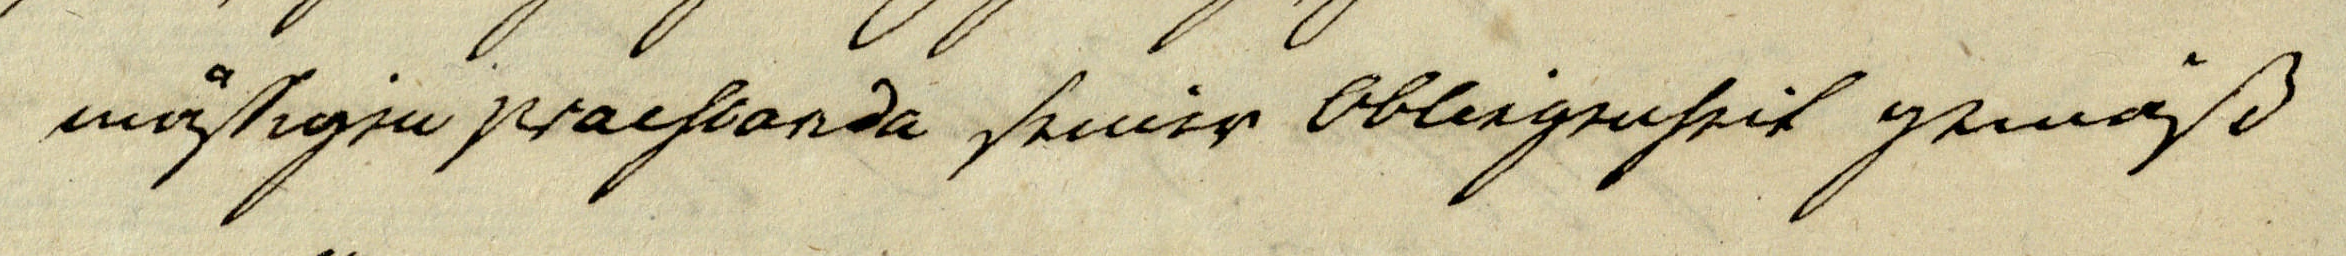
mässigen praestanda seiner Obliegenheit gemäß
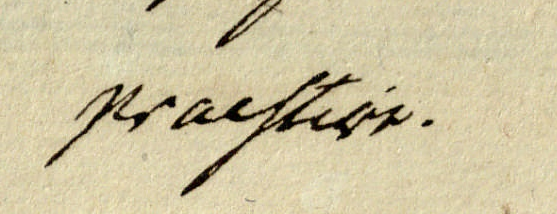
praestire.
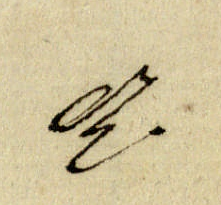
dh.
